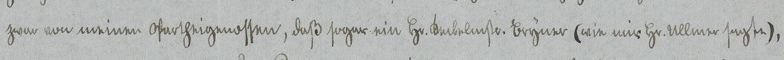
zwar von meinen Partheigenossen, daß sogar ein Hr. Seckelmstr Bryner (wie mir Hr. Ullmer sagte),
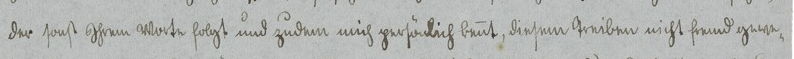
der sonst Ihrem Worte folgt und zudem mich persönlich kennt, diesem Treiben nicht fremd gewe-
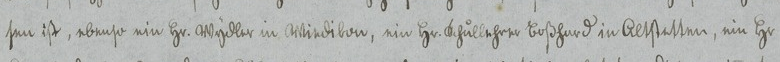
sen ist, ebenso ein Hr. Wydler in Wiedikon, ein Hr. Schullehrer Boßhard in Altstetten, ein Hr.
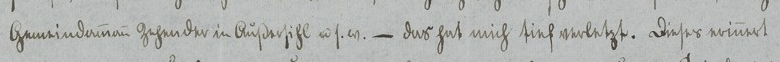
Gemeindammann Zehender in Außersihl u. s. w. – das hat mich tief verletzt. Dieses erinnert
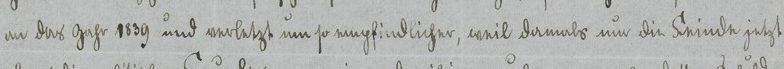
an das Jahr 1839 und verletzt um so empfindlicher, weil damals nur die Feinde jetzt
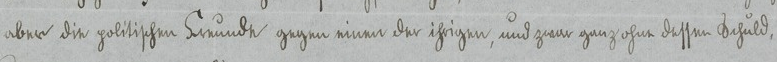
aber die politischen Freunde gegen einen der ihrigen, und zwar ganz ohne dessen Schuld,
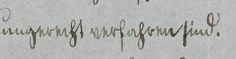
ungerecht verfahren sind.
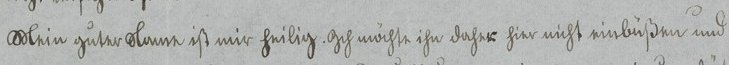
Mein guter Name ist mir heilig. Ich möchte ihn daher hier nicht einbüßen und
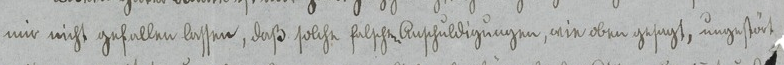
mir nicht gefallen lassen, daß solche falschen Beschuldigungen, wie oben gesagt, ungestört
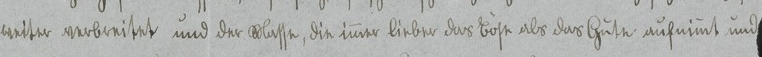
weiter verbreitet und der Masse, die immer lieber das Böse als das Gute aufnimmt und
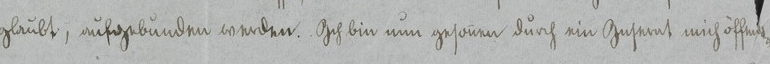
glaubt, aufgebunden werden. Ich bin nun gesonnen durch ein Inserat mich öffent-
